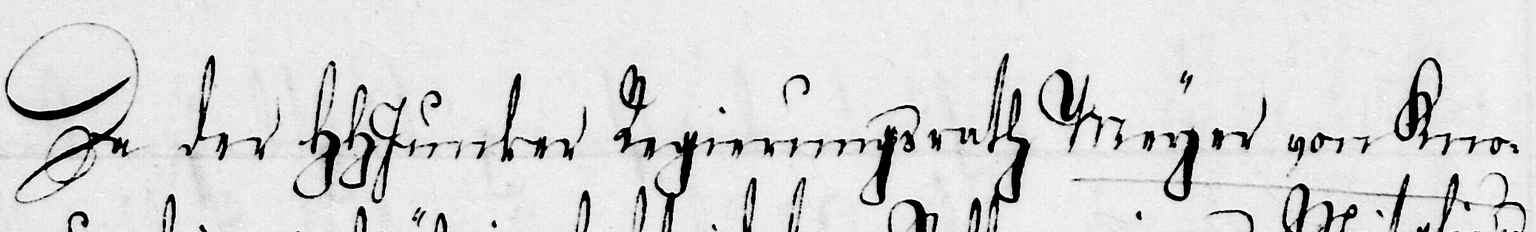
Da der HHJunker Regierungsrath Meyer von Kno¬
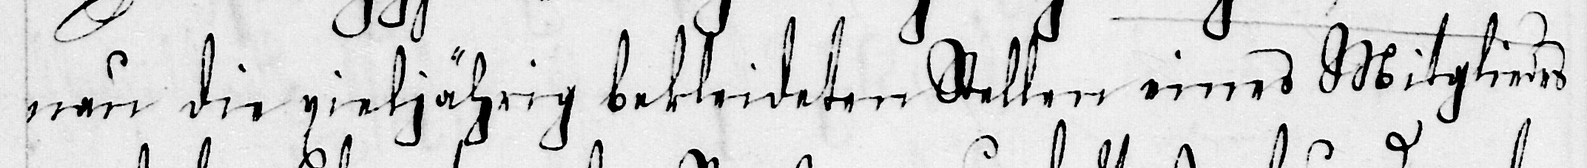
nau die vieljährig bekleideten Stellen eines Mitgliedes
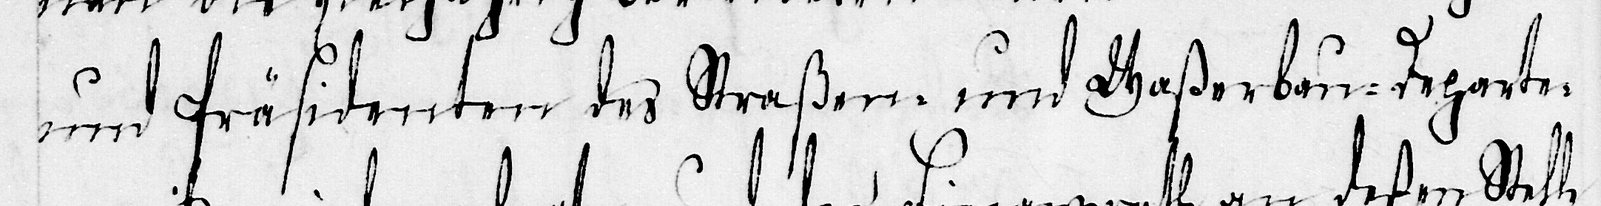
und Präsidenten des Straßen- und Waßerbau-Departe¬
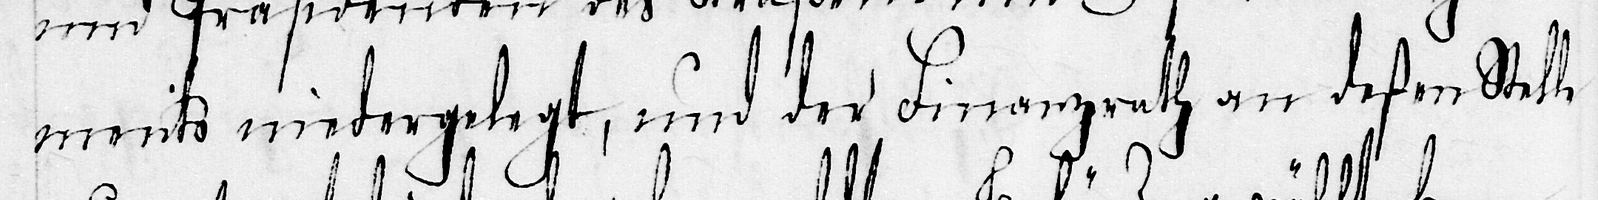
ments niedergelegt, und der Finanzrath an deßen Stel¬
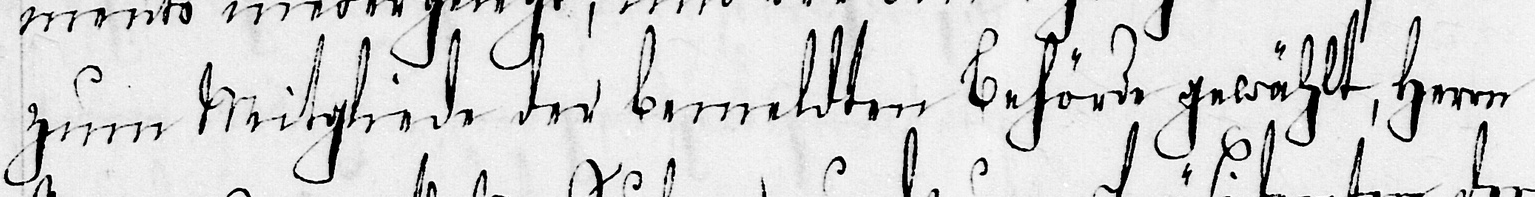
zum Mitgliede der bemeldten Behörde gewählt, Herrn
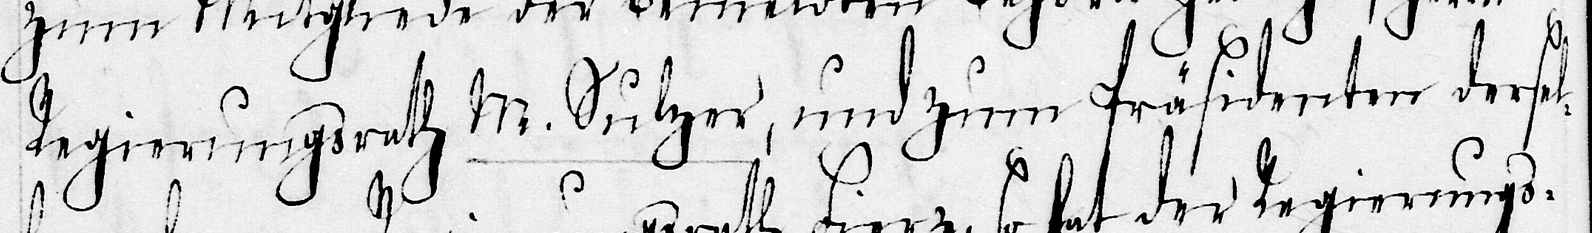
Regierungsrath M. Sulzer, und zum Präsidenten derse¬
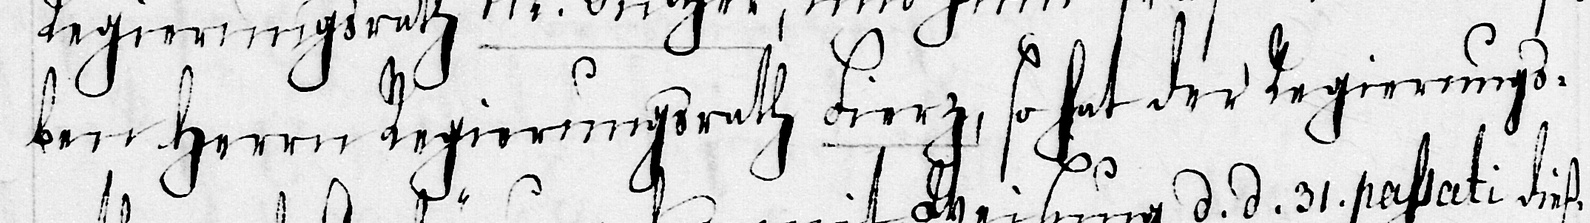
lben Herrn Regierungsrath Fierz, so hat der Regierungs¬
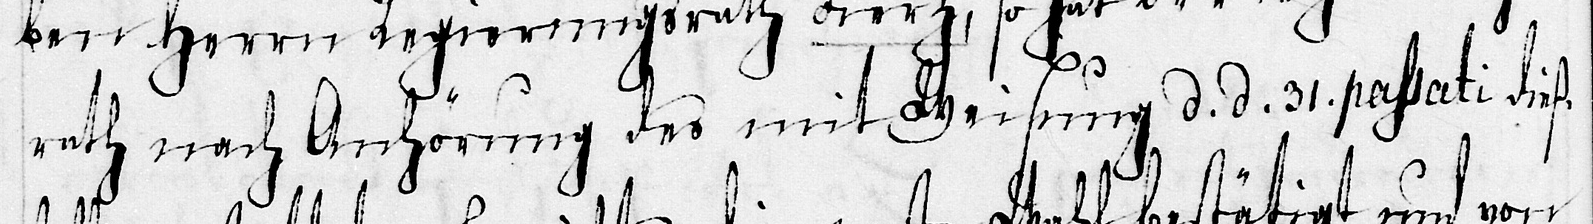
rath nach Anhörung des mit Weisung d. d. 31. passati dieß¬
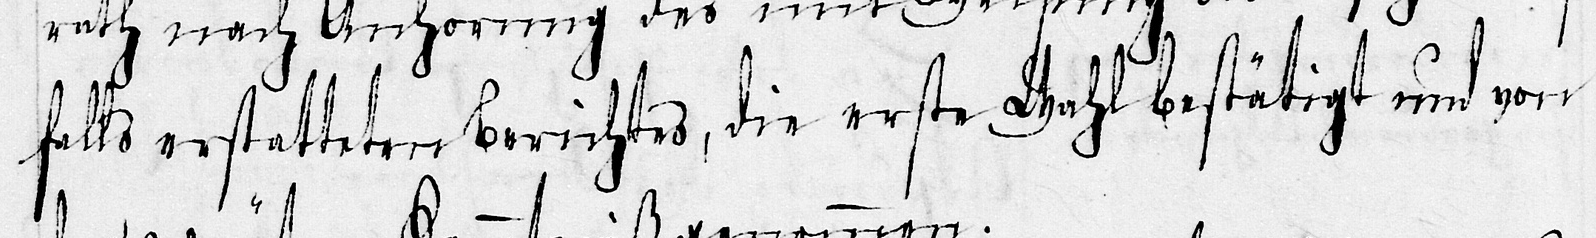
falls erstatteten Berichtes, die erste Wahl bestätigt und von
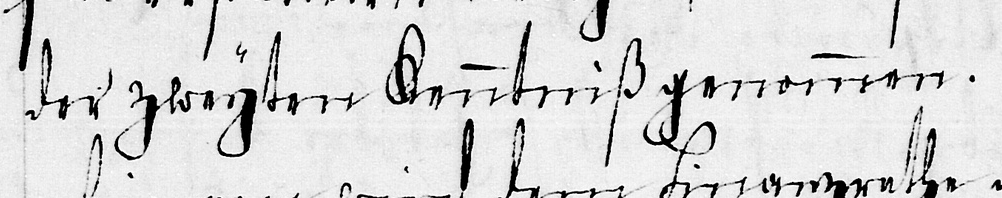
der zweyten Kenntniß genommen.
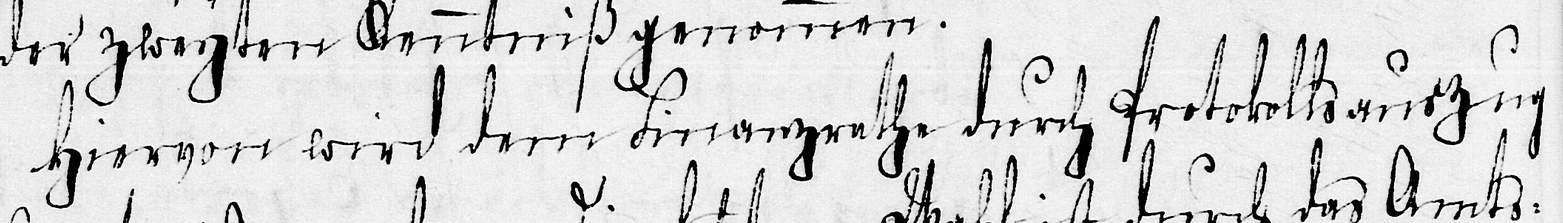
Hiervon wird dem Finanzrathe durch Protokollsauszug
